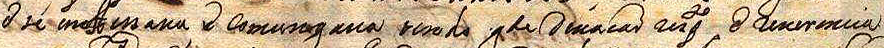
e se conffessaua, e comungaua tendo de deuação respto e reuerencia
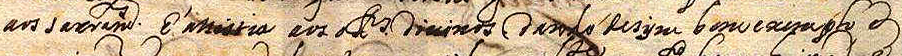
aos sacramtos. e assistia aos offos. diuinos dando de sym bom exemplo, e
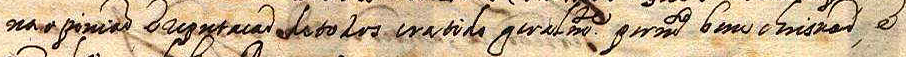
na opiniaõ e reputaçaõ de todos era tido geralm.te por mto bom christaõ, e
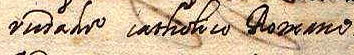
verdadro catholico Romano.
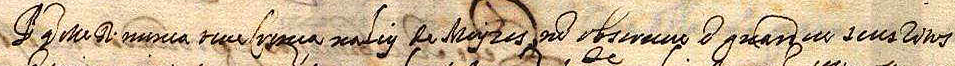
P q̄ elle R. nunca teue Crença na ley de Moyzes, nē obseruou e guardou seus ritos
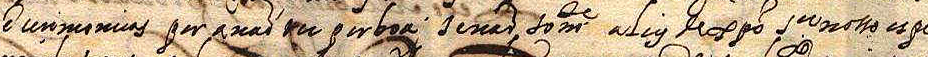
e cerimonias por a naõ ter por boa; senaõ somte. a ley de xpō s.or nosso espe
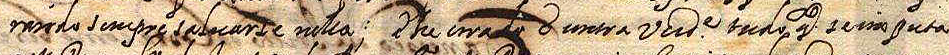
rando sempre saluarse nella; e he errado e contra verd.e tudo qto. se imputa
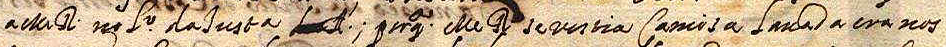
a elle R. no lo. da Iusta _ A.; porqto. elle R se uestia Camisa lauada era nos
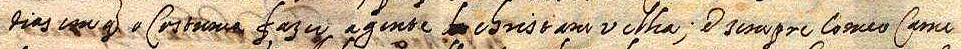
dias em q̄ o Costuma fazer a gente _ christam velha; e sempre comeo Carne
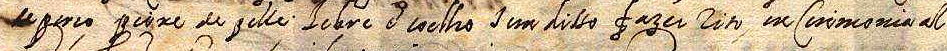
de porco, peixe de pelle, lebre e coelho sem disso fazer rito, ou Cerimonia al
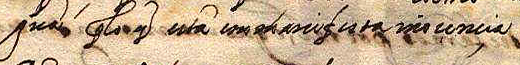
guā p̄lo q̄ esta em manifesta inocencia
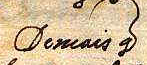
Demais q̄
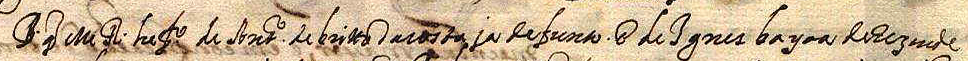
P. q̄ elle R. he f.o de Anto. de britto da costa ja defunto. e de Ignes bayoa de Rezende
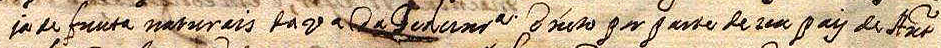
ia defunta naturais da va da Pedernra. e neto por parte de seu pay de Anto
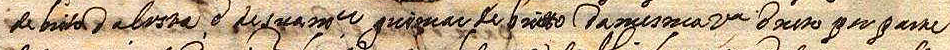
de brito da Costa, e de sua m.er guimar de britto da mesma va e neto por parte
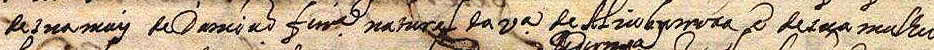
de sua may de Damiaõ ferr.a natural da va. de Aliubarrota, e de sua mulher
